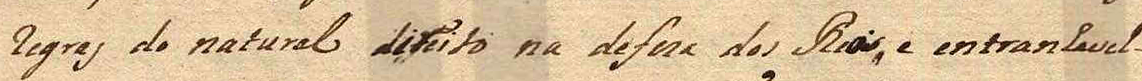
Regras do natural direito na defeza dos Reis, e entranhavel
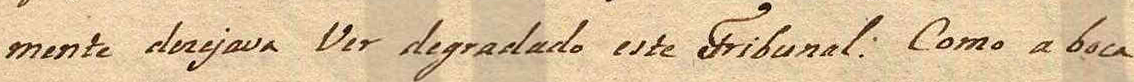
mente dezejava Ver degradado este Tribunal. Como a boca
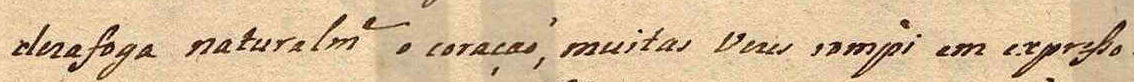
dezafoga naturalm.e o coraçaõ, muitas vezes rompi em expresso
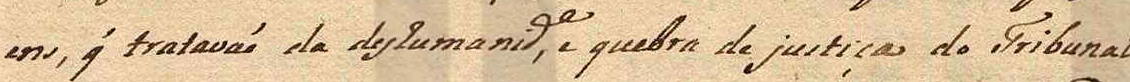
ens, q̄ tratavaõ da deshumanid.e, e quebra de justiça do Tribunal
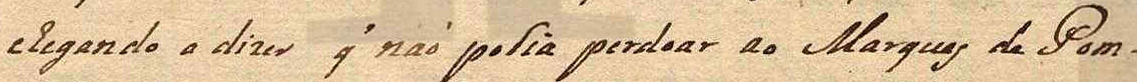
chegando a dizer q̄ naõ podia perdoar ao Marques de Pom
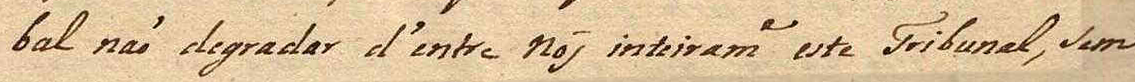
bal naõ degradar d'entre nós inteiram.e este Tribunal, sem
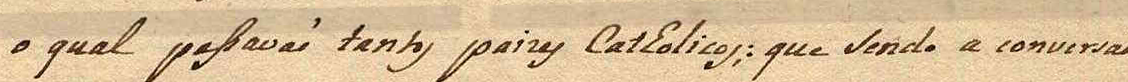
o qual passavaõ tantos paizes Catholicos: que sendo a conversaõ
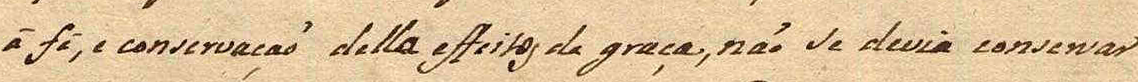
á fé, e conservaçaõ della effeitos da graça, naõ se devia conservar
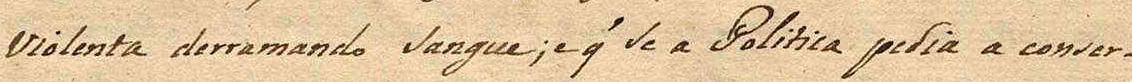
violenta derramando sangue; e q̄ se a Politica pedia a conser
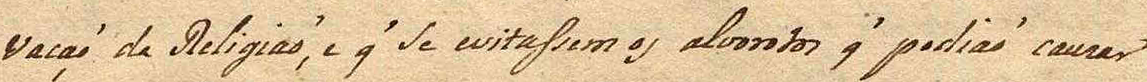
vaçaõ da Religiaõ, e q̄ se evitassem os alvorosos q̄ podiaõ cauzar
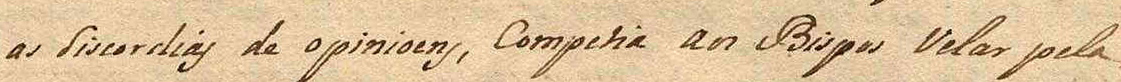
as discordias de opinioens, Competia aos Bispos Velar pela
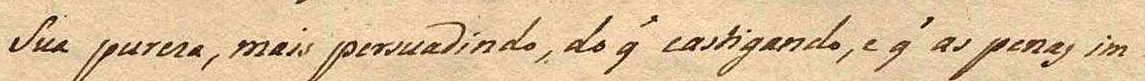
Sua pureza, mais persuadindo, do q̄ castigando, e q̄ as penas in
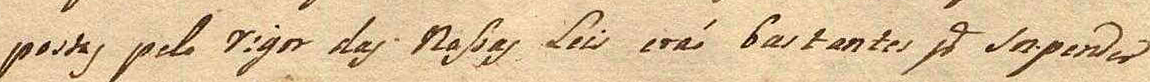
postas pelo rigor das Nossas Leis eraõ bastantes p.a sospender
